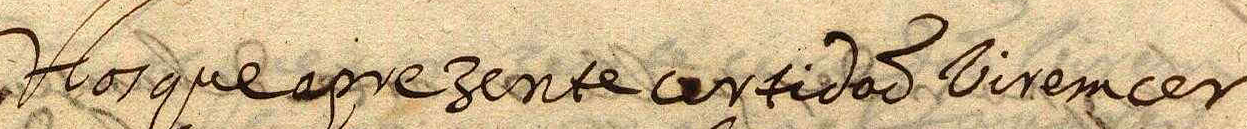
Aos que a prezente certidaõ virem cer
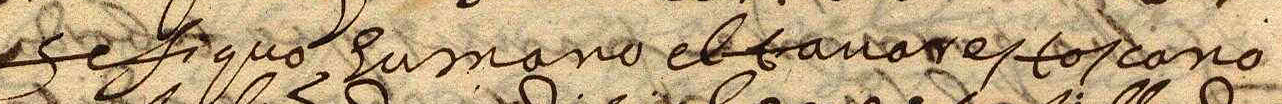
tefiquo Eu manoel tauares toscano
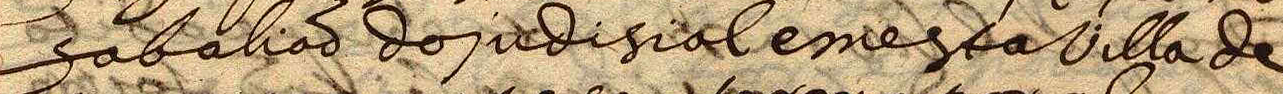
tabaliaõ do judisial em esta villa de
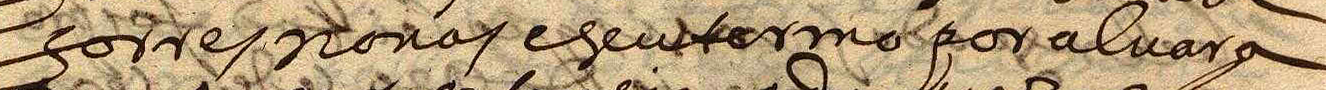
torres nouas e seu termo por aluara
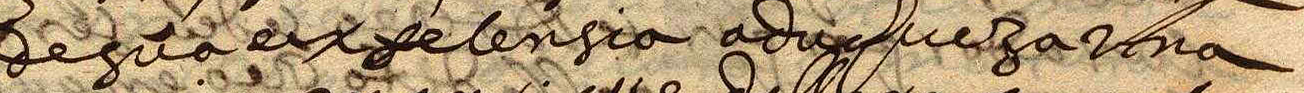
de sua e exselensia a duqueza Ana
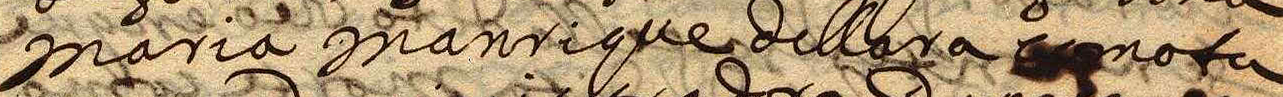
maria manrique de llara como tu
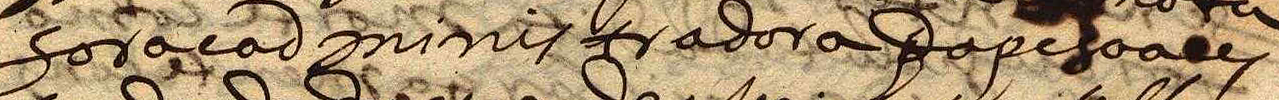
tora e administradora da pesoa e es
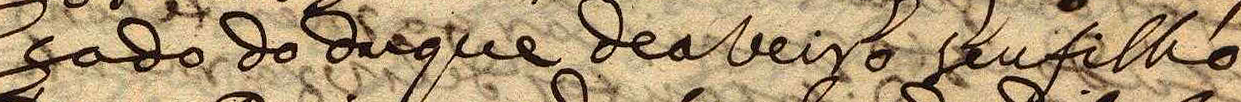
tado do duque de aveiro seu filho
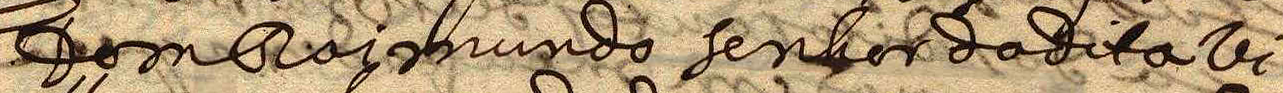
Dom Raimundo senhor da dita vi
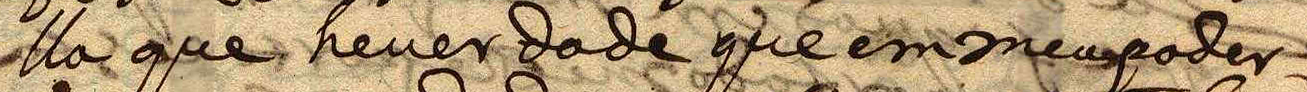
lla que he uerdade que em meu poder
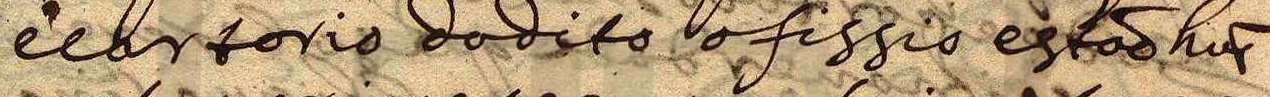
e cartorio do dito ofissio estão hūs
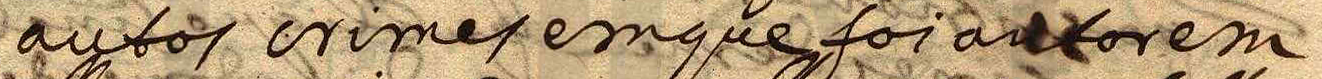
autos crimes em que foi autor em
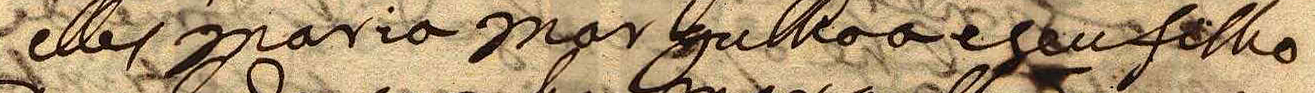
elles maria margulhoa e seu filho
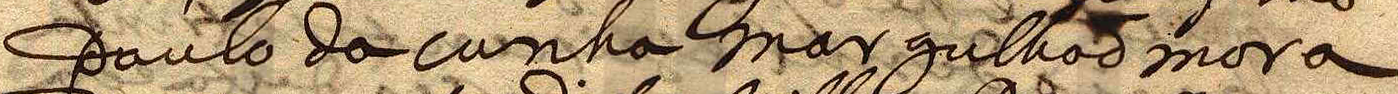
Paulo da cunha margulhaõ mora
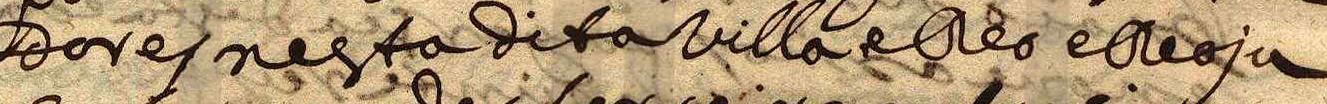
dores nesta dita villa e Reo e Reo ju
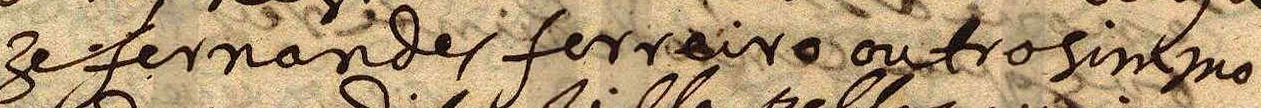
ze fernandes ferreiro outrosim mo
